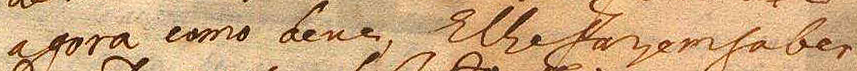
agora como deue, E lhe fazem saber
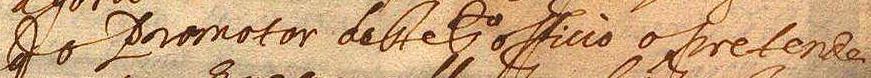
q̄ o Promotor deste sto officio o pretende
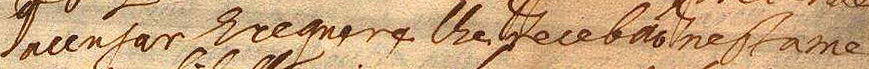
accusar E requerelhe recebão nesta me
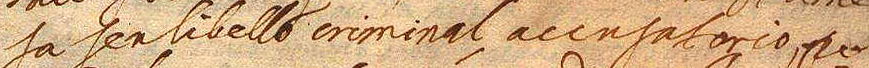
sa seu libello criminal accusatorio, pe
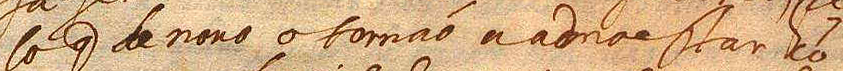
lo q̄ de nouo o tornão a admoestar cō
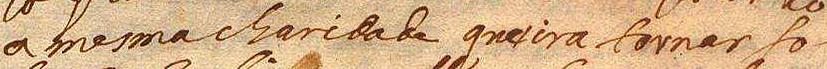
a mesma charidade queira tornar so
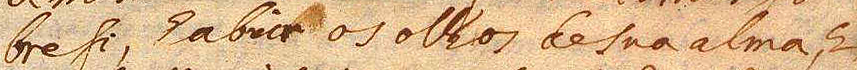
bre si, E abrir os olhos de sua alma, E
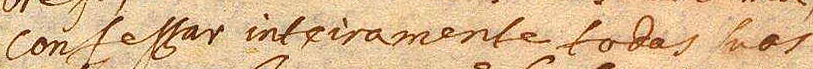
confessar inteiramente todas suas
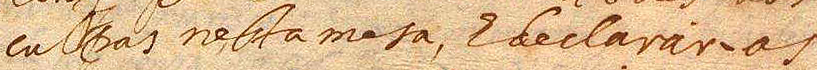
culpas nesta mesa, E declarar as
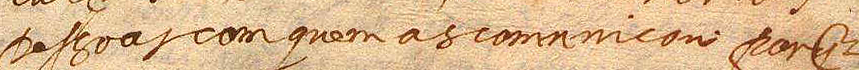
pessoas com quem as comunicou porq̄
